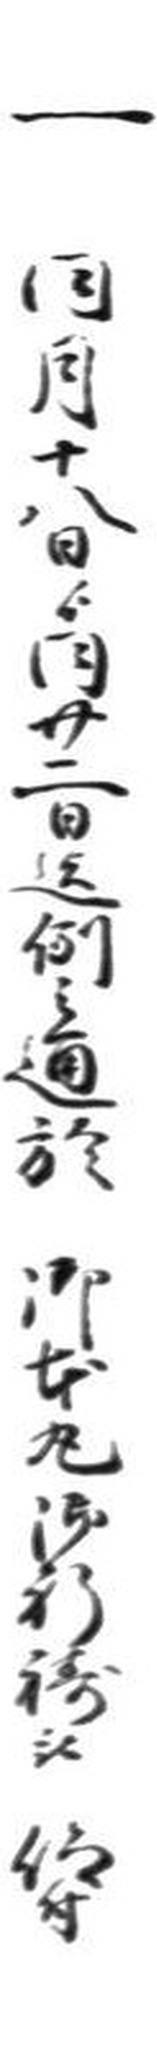一同月十八日ゟ同廿二日迄例之通於御本丸御祈祷被仰付
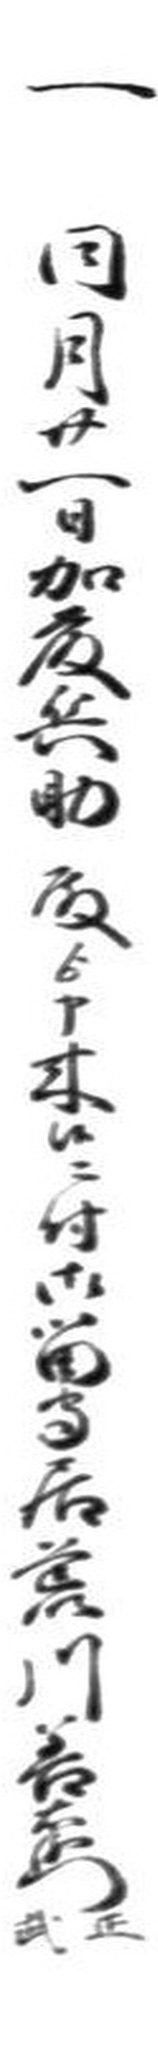一同月廿一日加藤兵助殿ゟ申来候ニ付御留守居荒川善右衛門正武
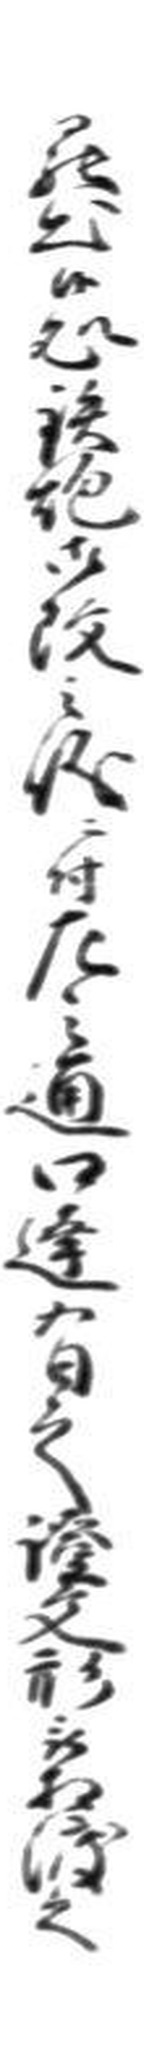罷出候処鉄砲御改之儀ニ付左之通口達有之証文形被相渡之
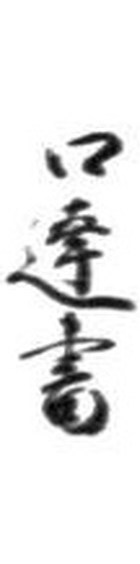口達書
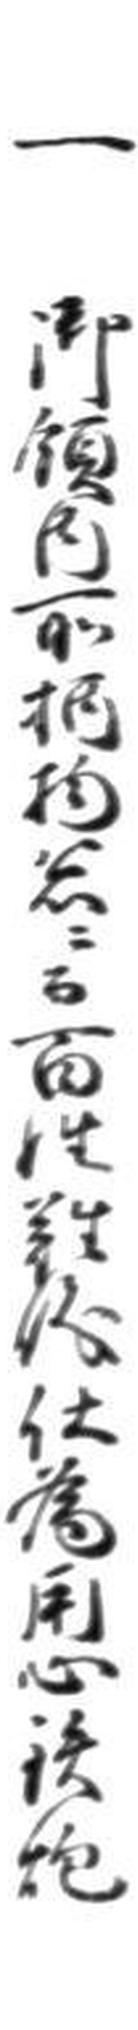一御領内所柄物忩ニ而百姓難儀仕為用心鉄砲
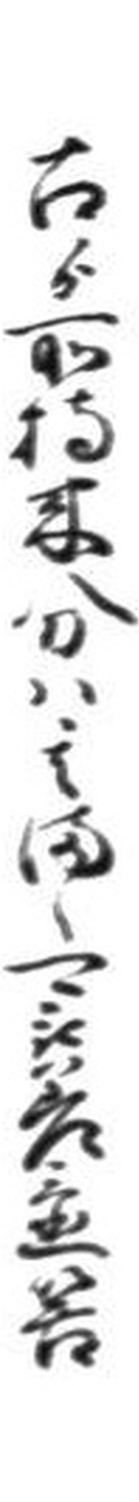古ゟ所持来分ハ其まゝ可被差置筈

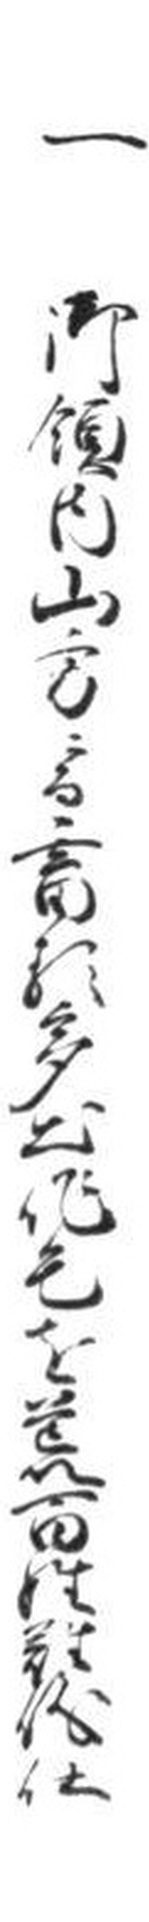一御領内山方ニ而畜類多出作毛を荒百姓難儀仕
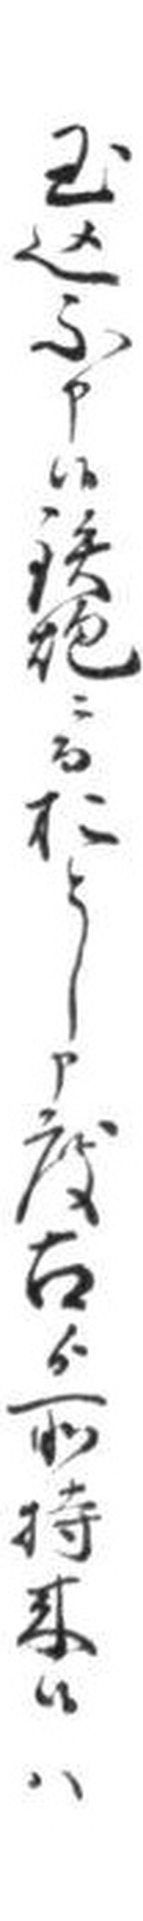玉込不申候鉄砲ニ而おとし申度古ゟ所持来候ハ
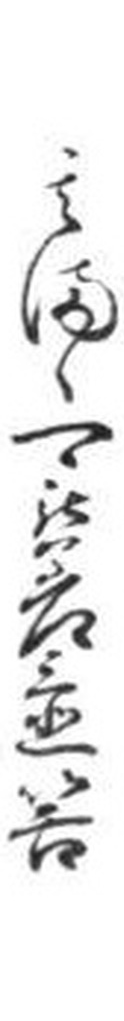其まゝ可被差置筈
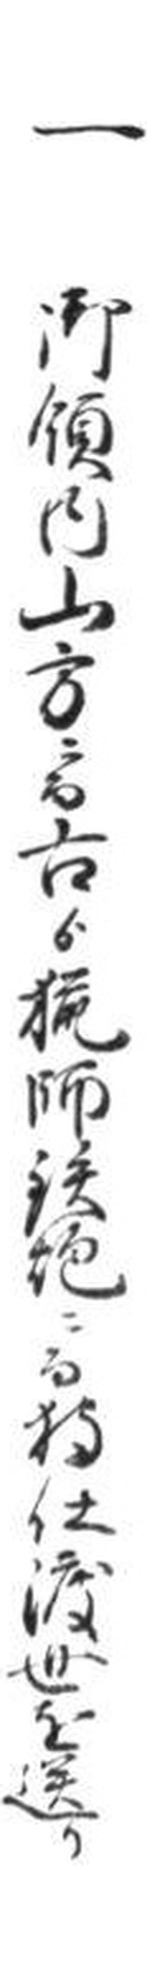一御領内山方ニ而古ゟ猟師鉄砲ニ而狩仕渡世を送り
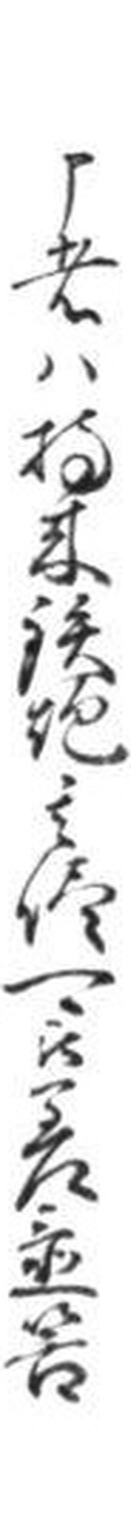申者ハ持来鉄砲其儘可被差置筈
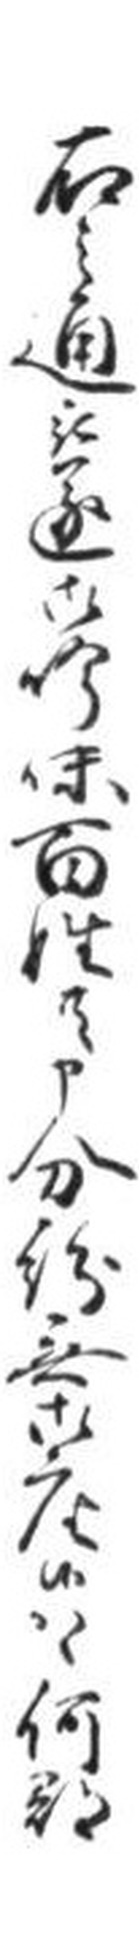右之通被遂御吟味百姓共申分紛無御座候ハヽ何郡
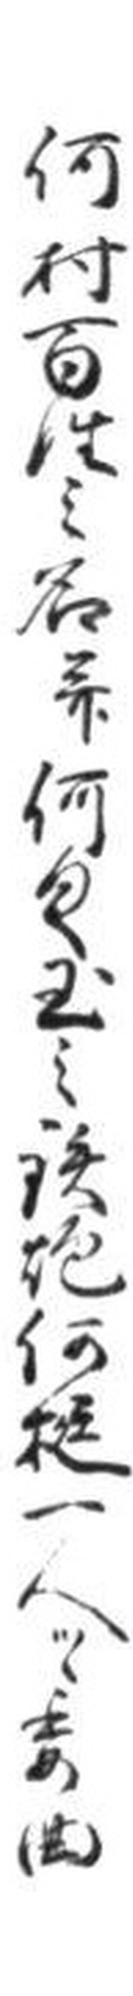何村百姓之名并何匁玉之鉄砲何挺一人ツヽ委曲
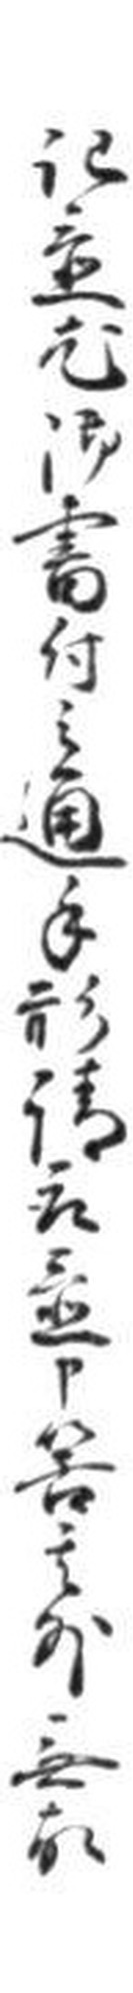記置尤御書付之通手形請取置申筈其外無故
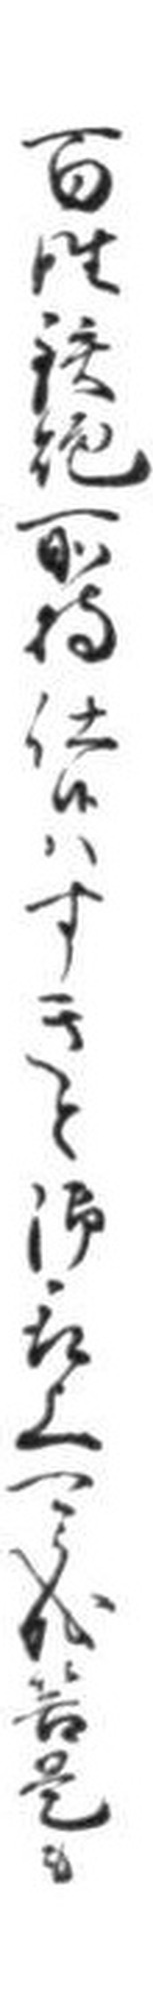百姓鉄砲所持仕候ハすきと御取上可被成筈是も
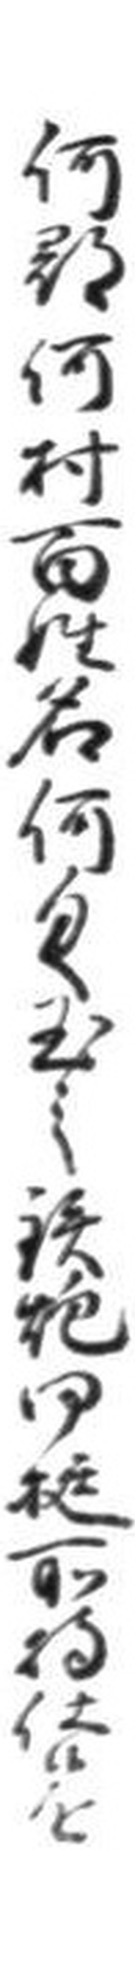何郡何村百姓名何匁玉之鉄砲何挺所持仕候を
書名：家譜 十七 吉品公 従元禄元年到同二年
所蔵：福井県文書館 Fukui Prefectural Archives
